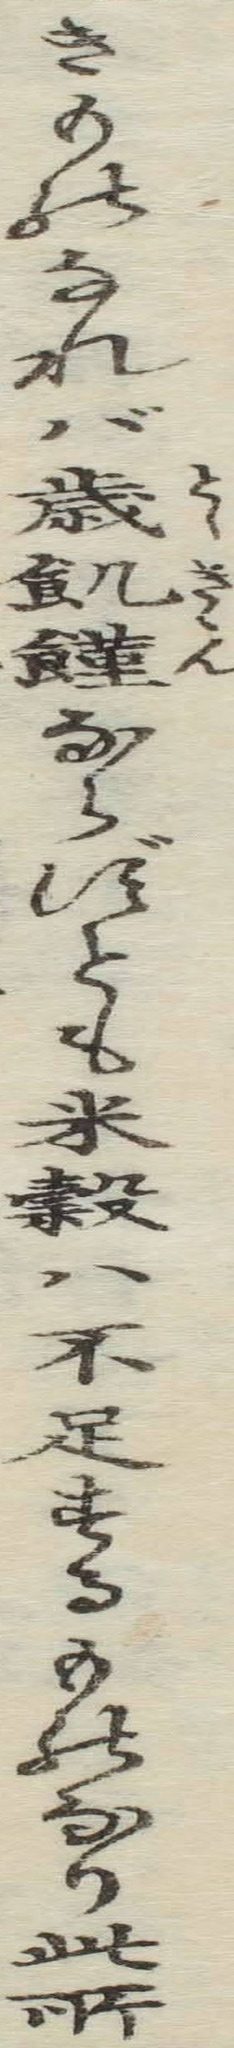きものなれば歳飢饉ならずとも米穀は不足するものなり此所
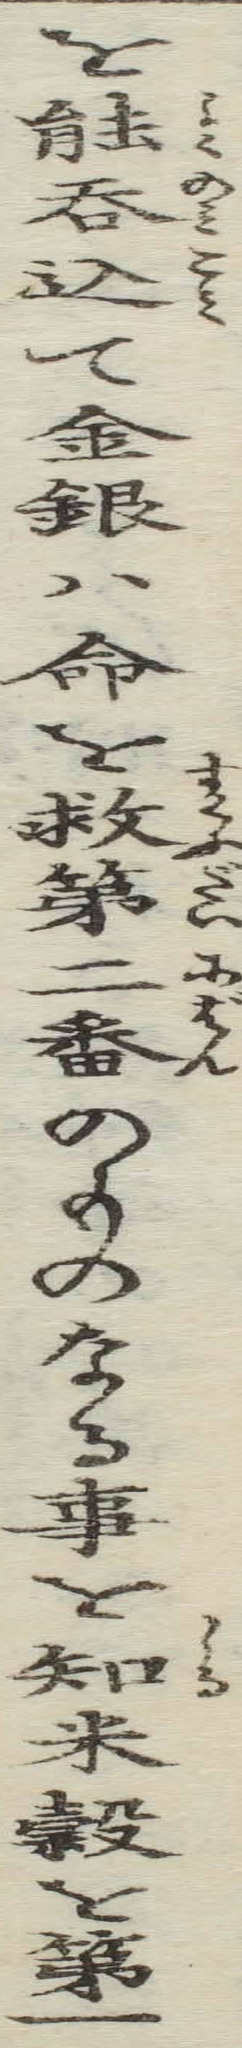を能呑込て金銀は命を救第二番のものなる事を知米穀を第一
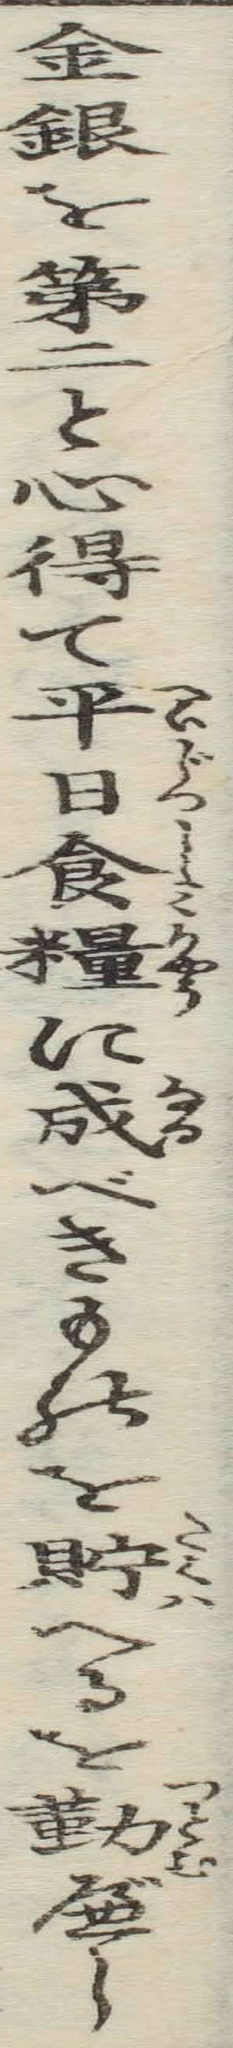金銀を第二と心得て平日食糧に成べきものを貯へるを勤べし
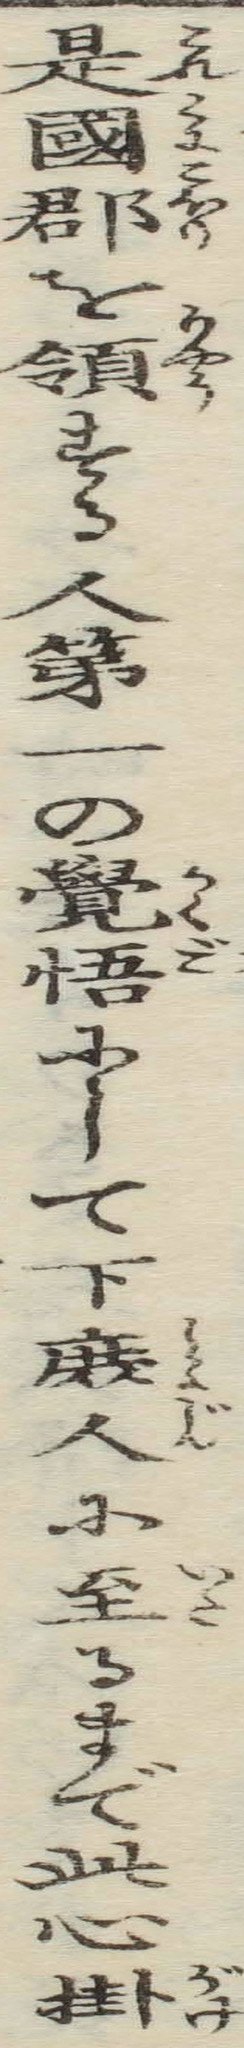是国郡を領する人第一の覚悟にして下庶人に至るまで此心掛
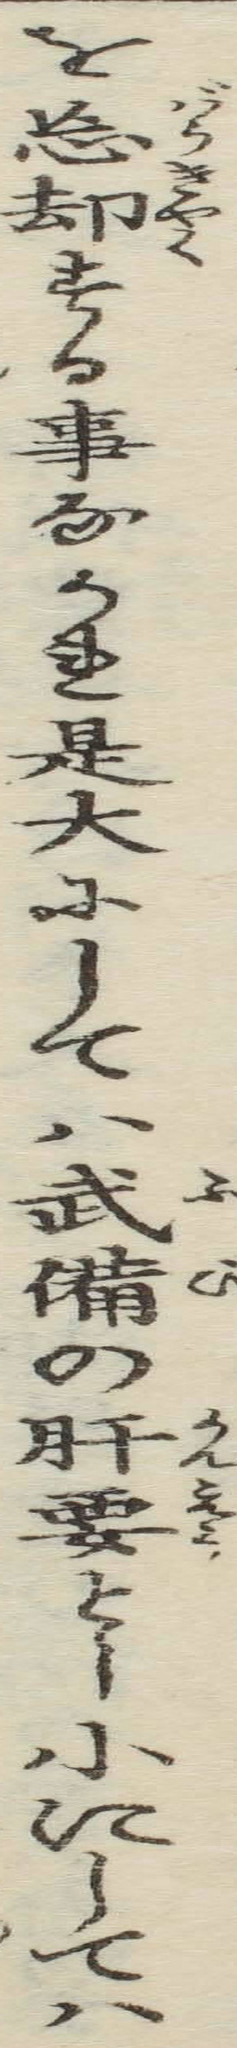を忘却する事なかれ是大にしては武備の肝要とし小にしては
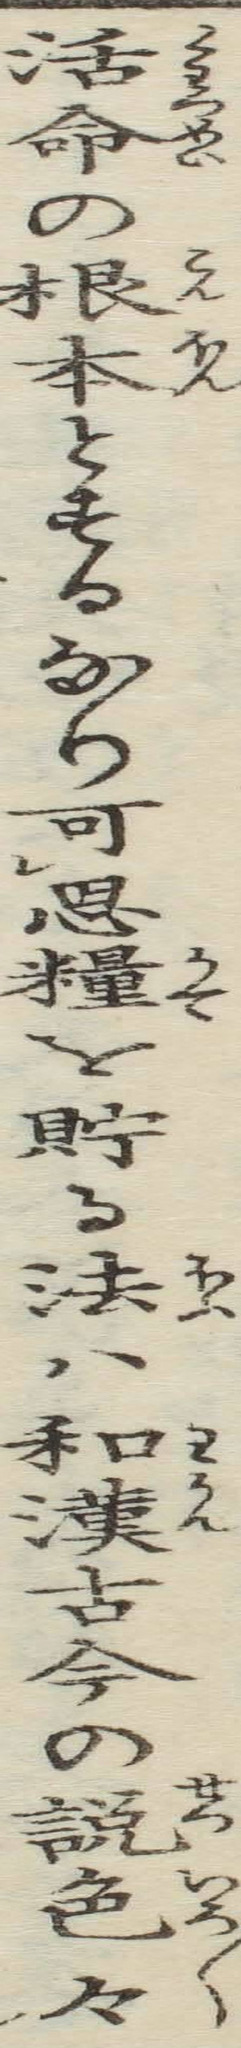活命の根本とするなり可思糧を貯る法は和漢古今の説色々
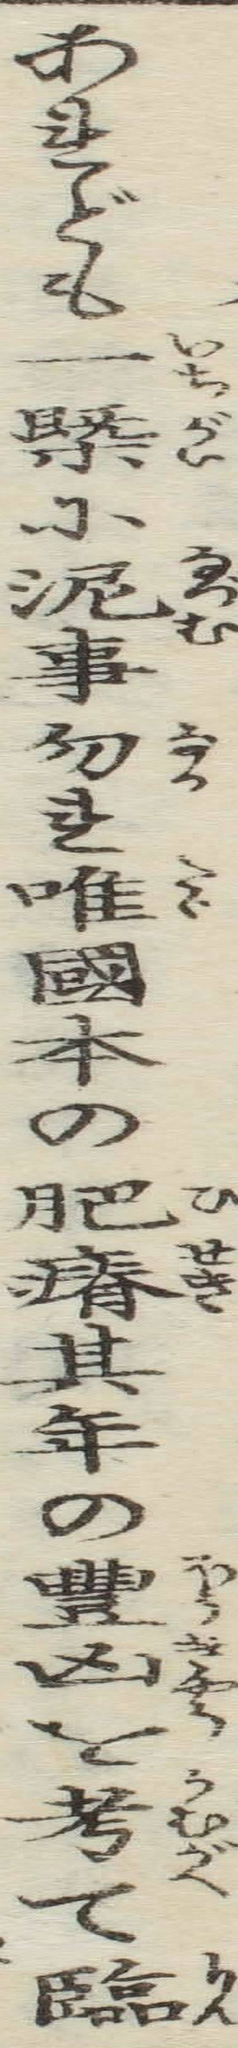あれども一㮣に泥事勿れ唯国本の肥瘠其年の豊凶を考て臨
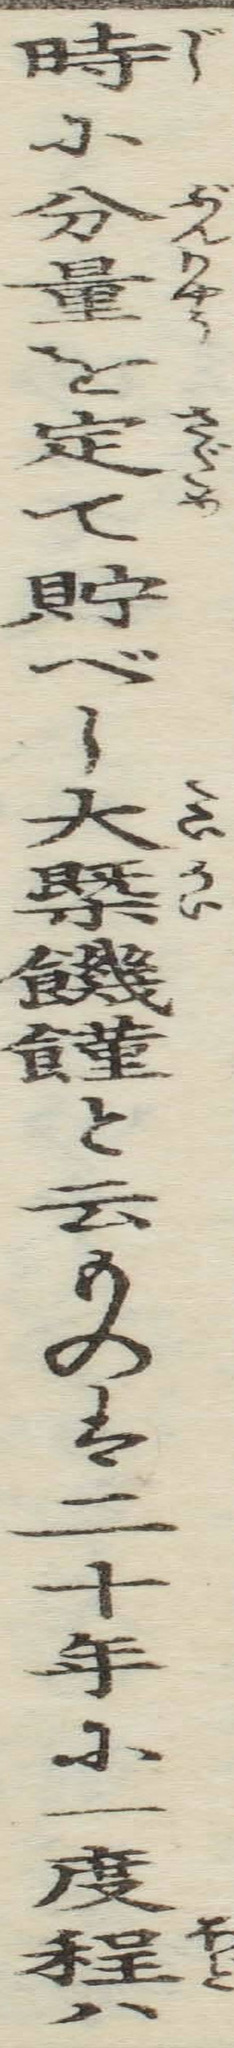時に分量を定て貯べし大㮣饑饉と云ものは二十年に一度程は
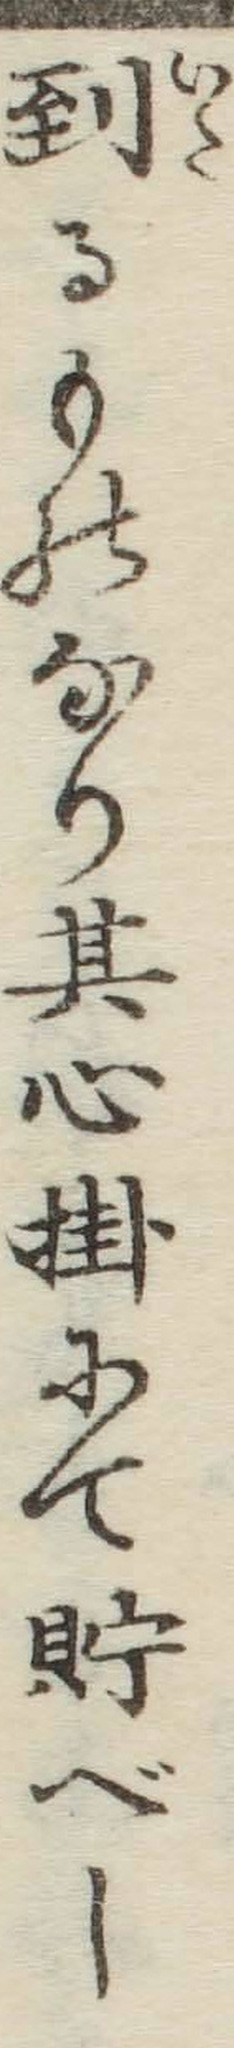到るものなり其心掛にて貯べし
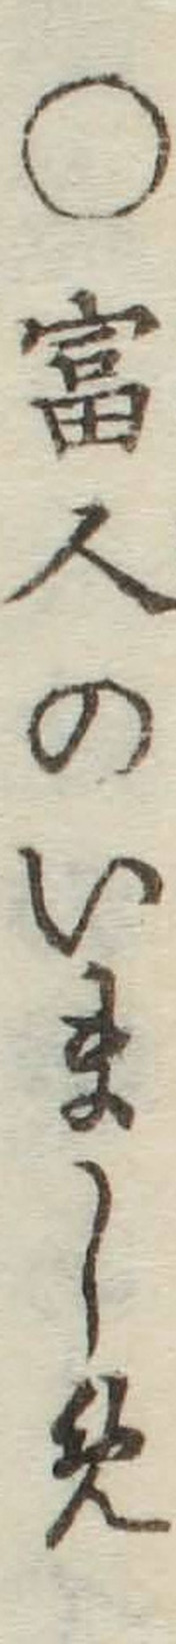○富人のいましめ

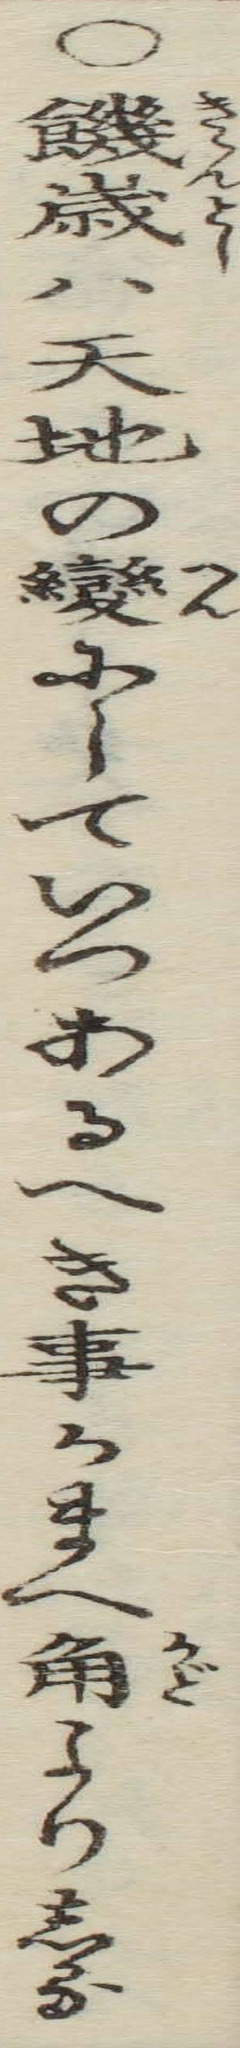○饑歳は天地の変にしていつあるへき事かまへ角よりしる
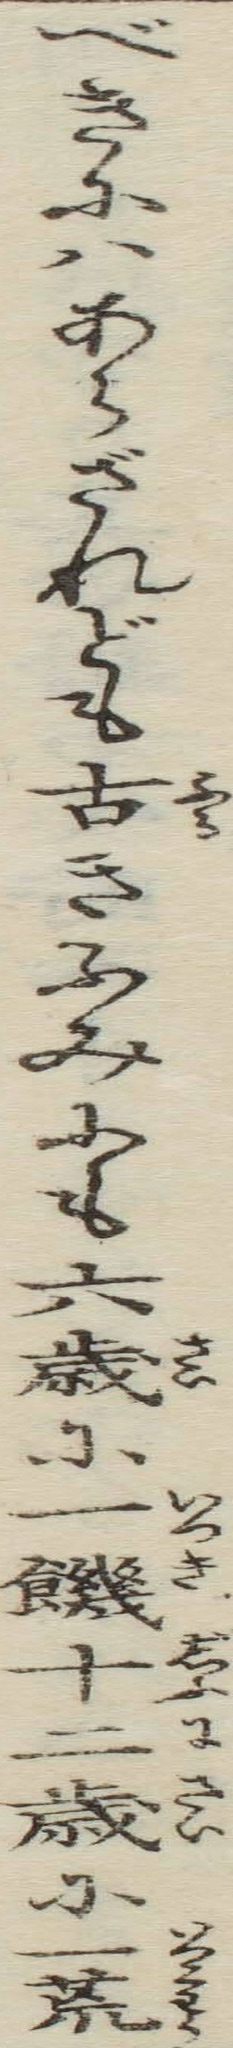べきにはあらざれども古きふみにも六歳に一饑十二歳に一荒
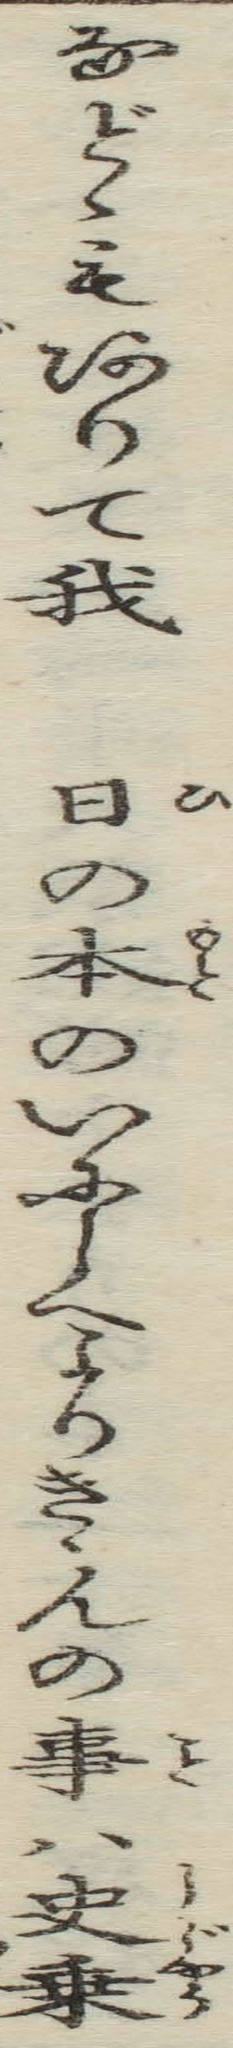などゝもありて我日の本のいにしへよりきゝんの事は史乗
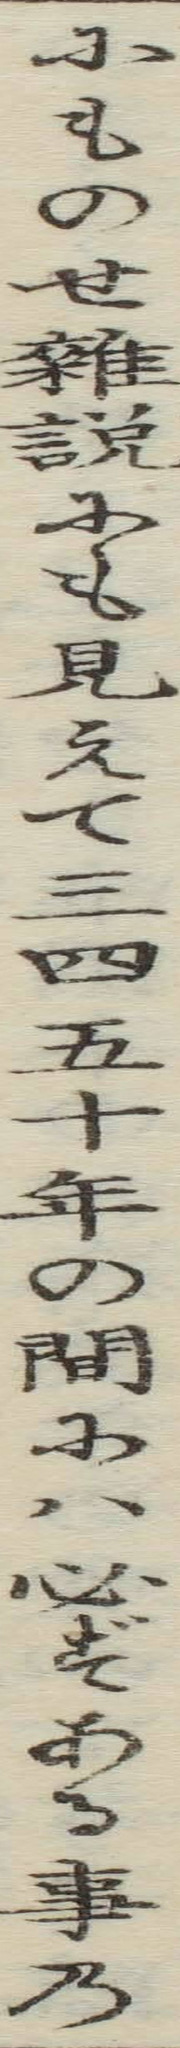にものせ雑説にも見えて三四五十年の間には必ずある事の
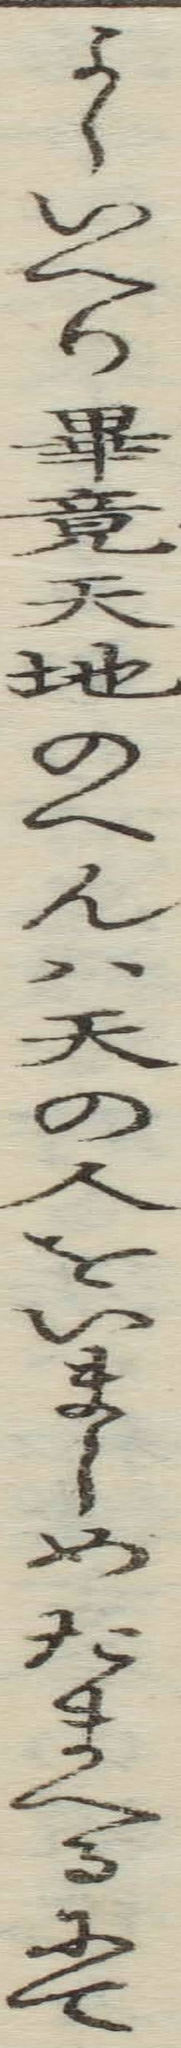よしいへり畢竟天地のへんは天の人をいましめたまへるにて
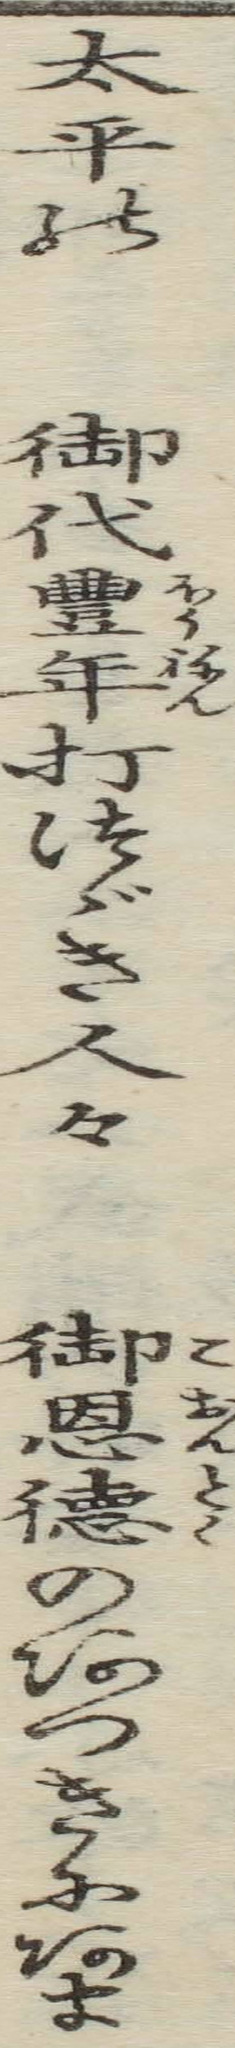大平の御代豊年打つゞき人々御恩徳のあつきにあま
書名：救荒便覧
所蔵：国文学研究資料館
